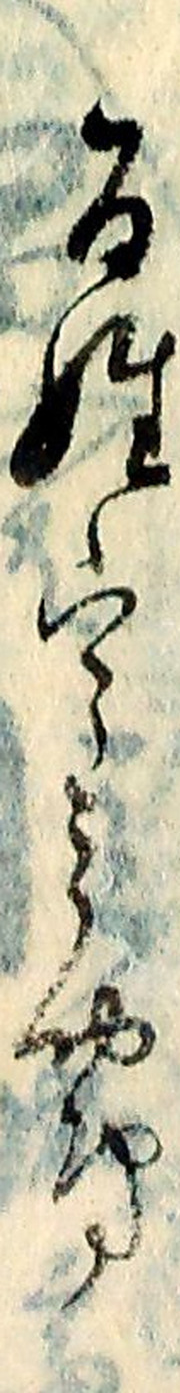百姓宇之助守
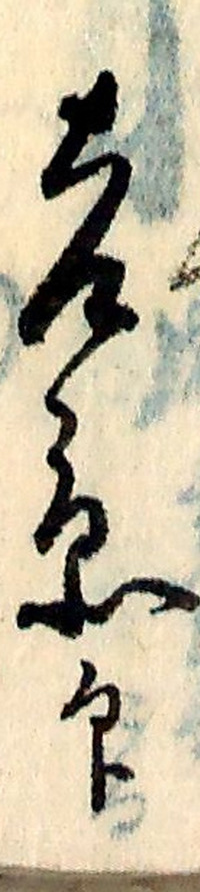吉兵衛印
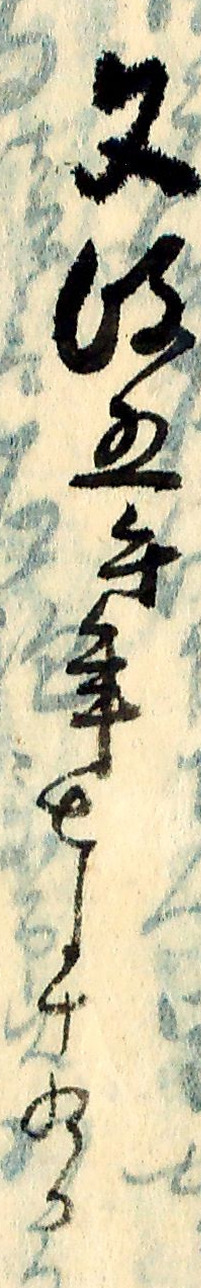文政五午年七月十九日
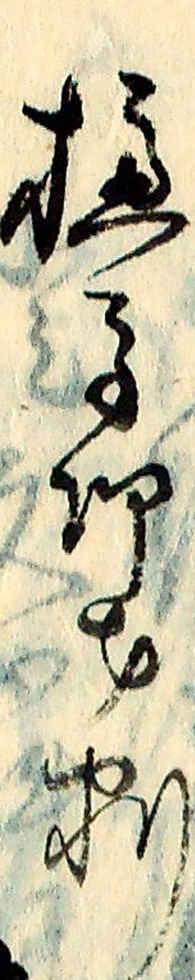櫨方御才判
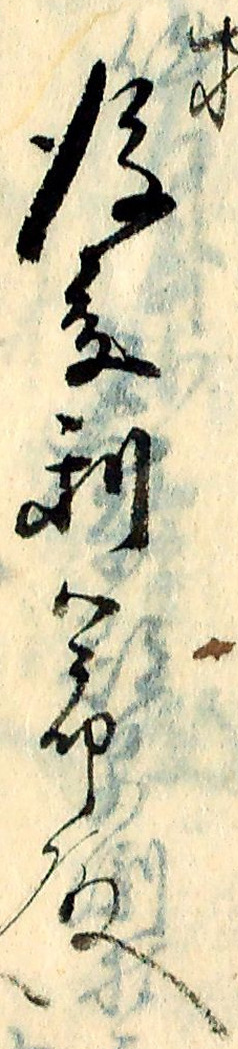後藤利八郎殿
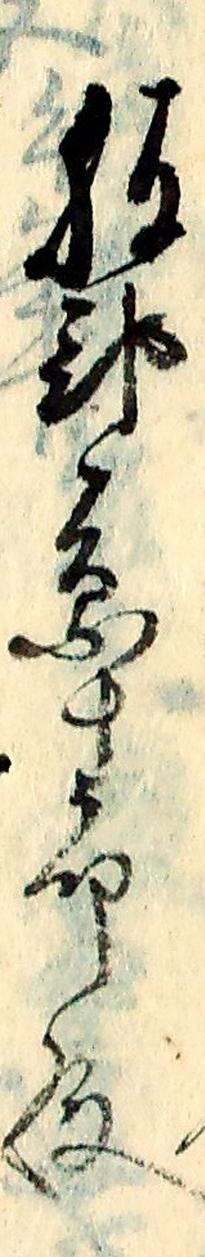服部円十郎殿

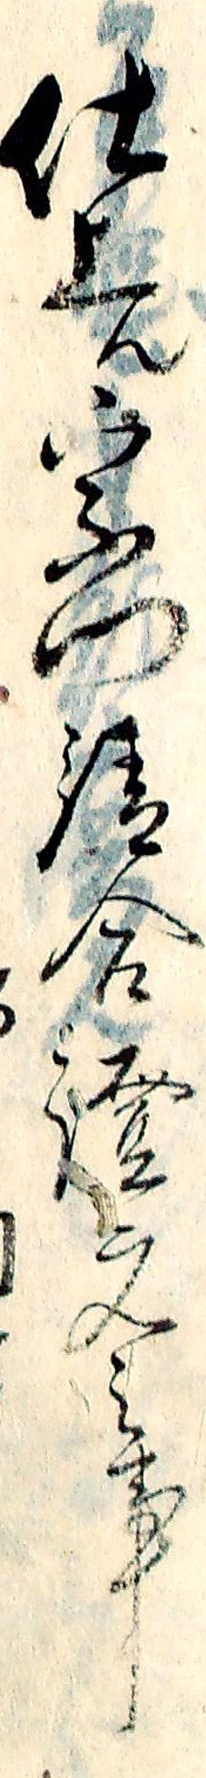仕上る宗門請合証文之事
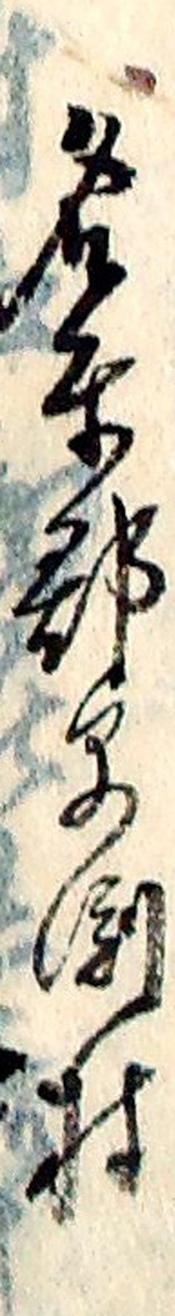名東郡早淵村
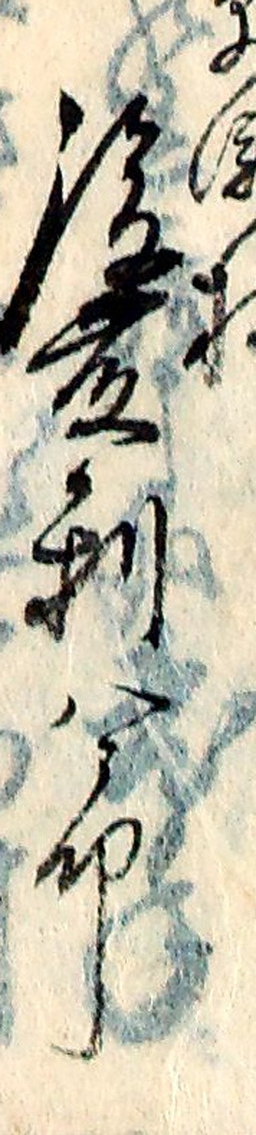後藤利八郎
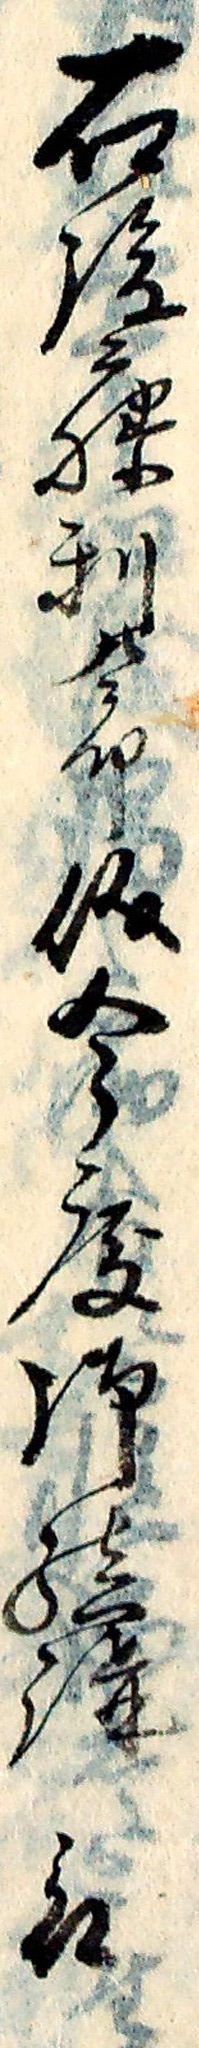右後藤利八郎儀今度御結構被
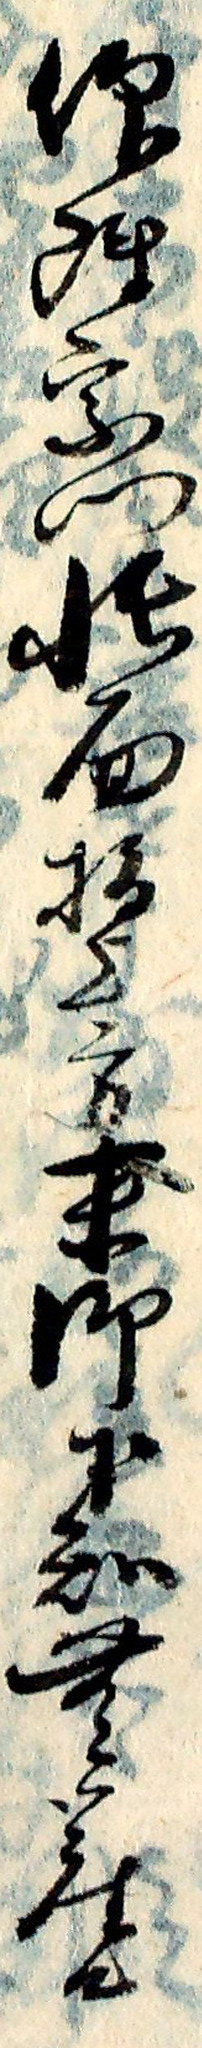仰付宗門帳面指上方未御下知無御座候
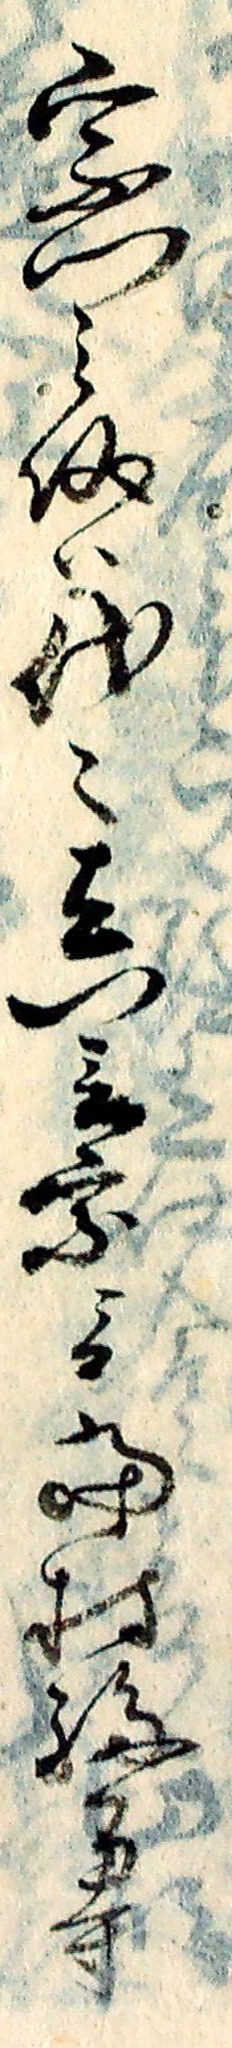宗門之儀は代々真言宗にて当村福万寺
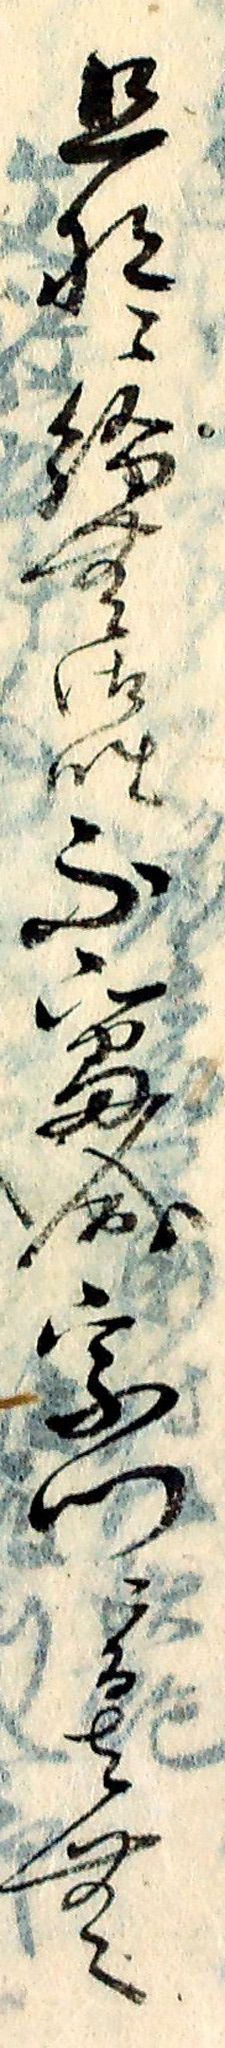旦那に紛無御座不審成宗門にては無
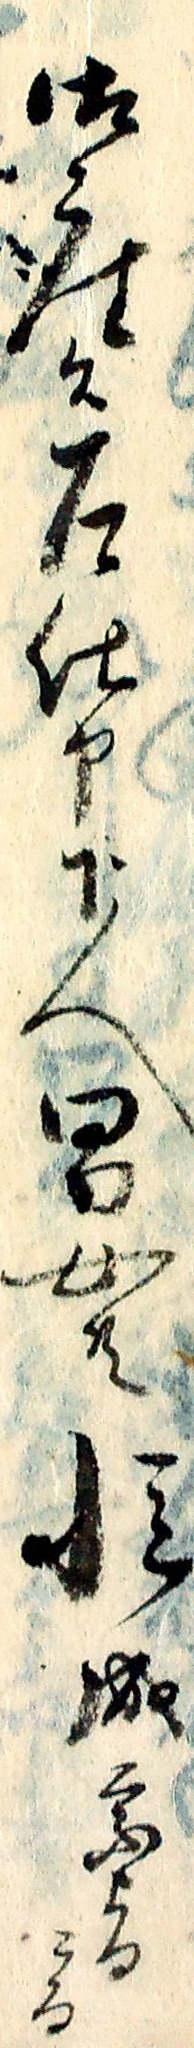御座候召仕申下人男女共慥成宗旨にて
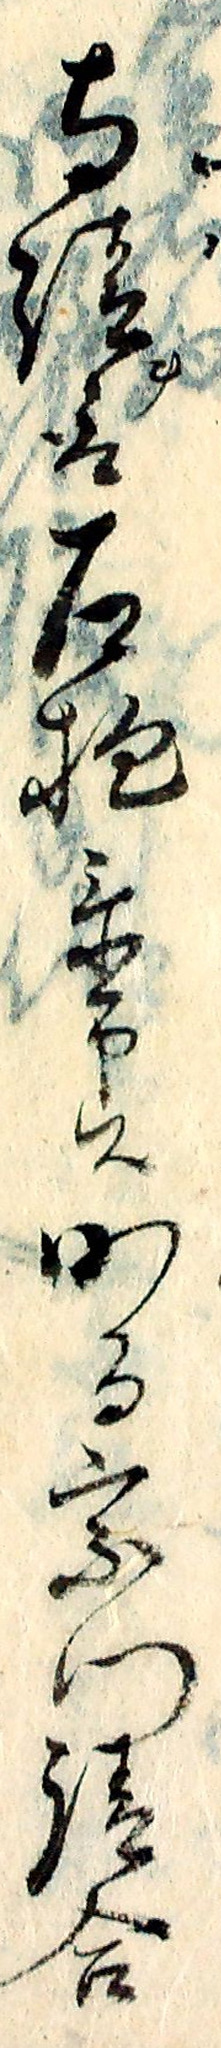寺請を取召抱置申候仍て宗門請合
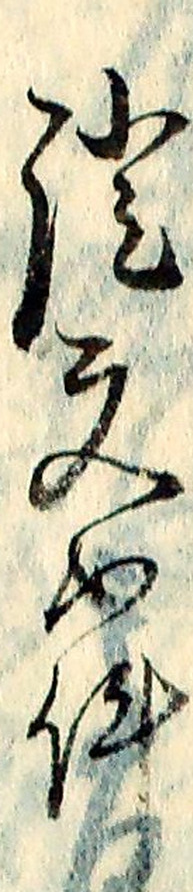証文如件
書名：諸御願書控(後藤氏壱番）
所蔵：鳴門教育大学 Naruto University of Education
